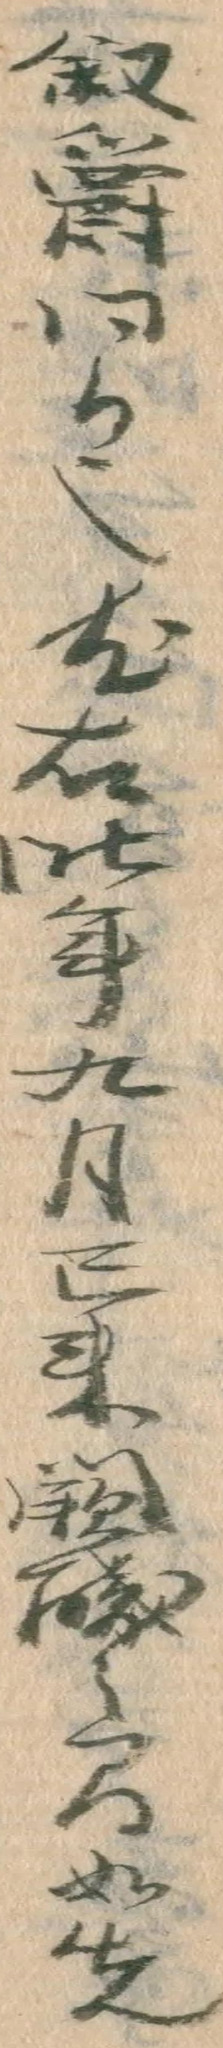叙爵、同日也、尤右昨年九月已来闕職之間、如先
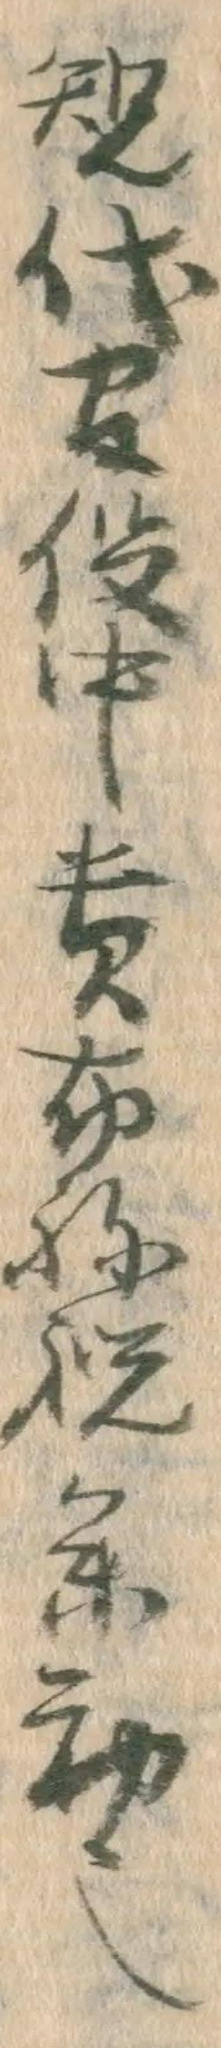規代官役中責布称祝参勤也
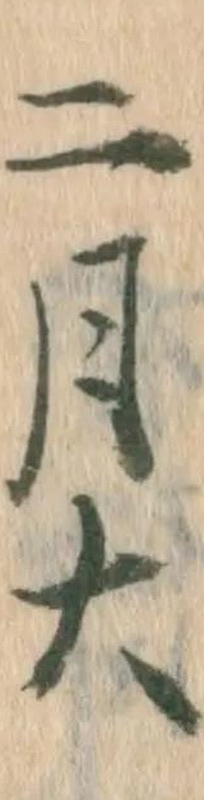二月大
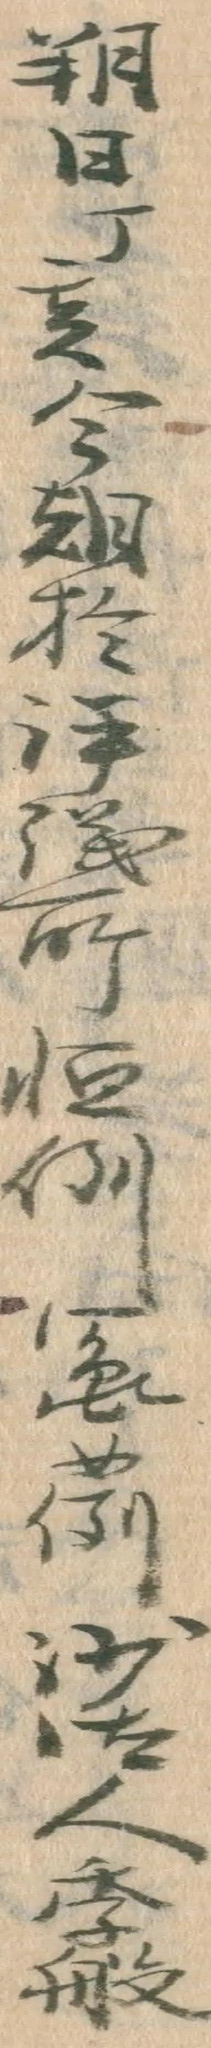朔日丁亥、今朝於評議所恒例鬮如例、沙汰人季般・
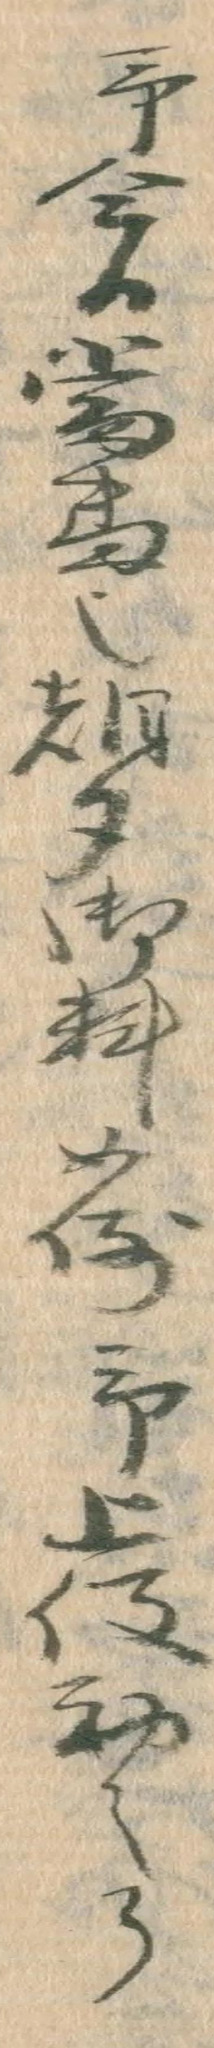予今日當番之朝夕御料如例、予上役勤之了、
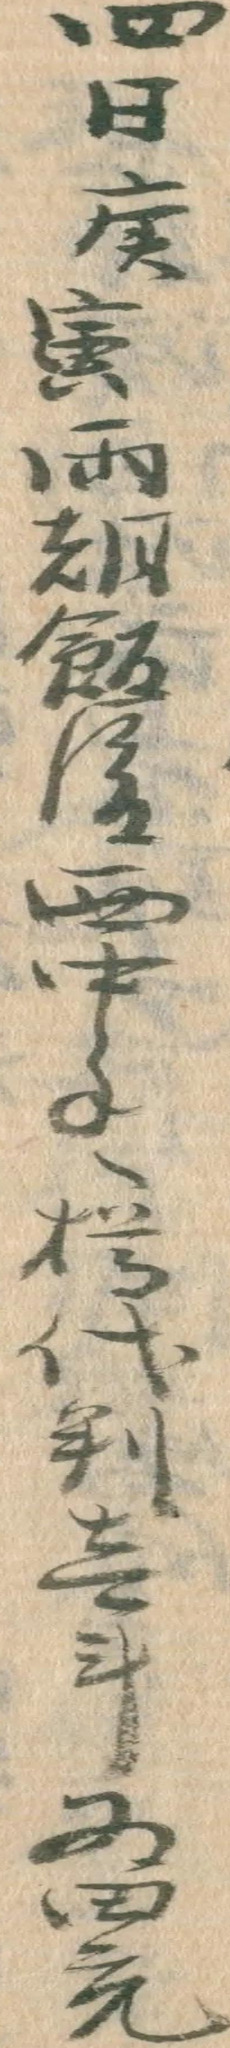四日庚寅雨、朝飯後西中手へ樽代判壱斗、為田充
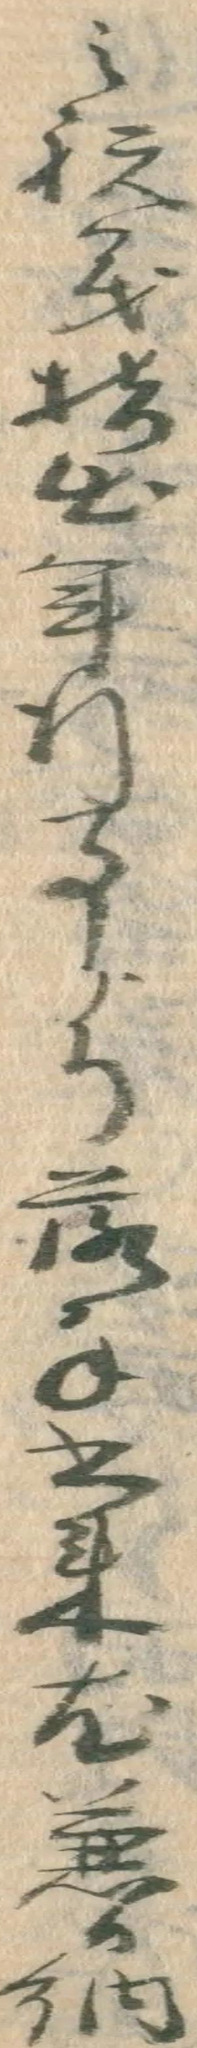之祝義指出、年行事より前年書来、尤兼而納
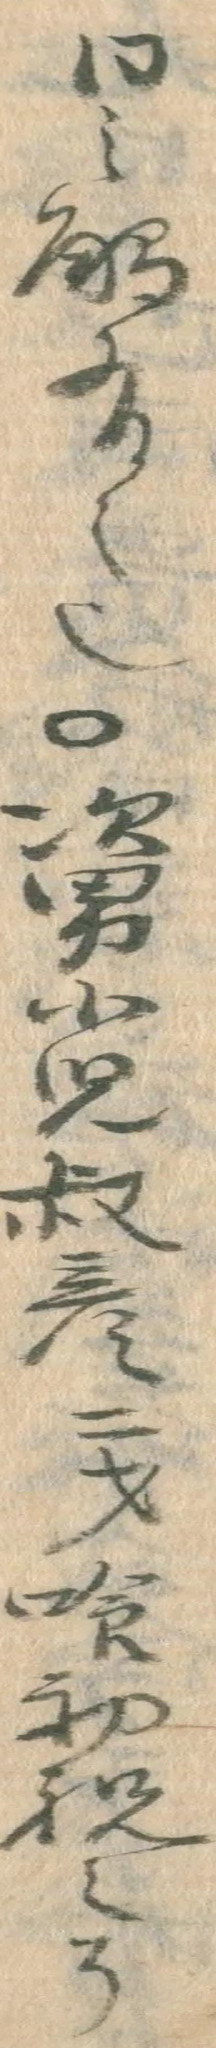日之触有之也○次男小児叔彦二才喰初祝之了、
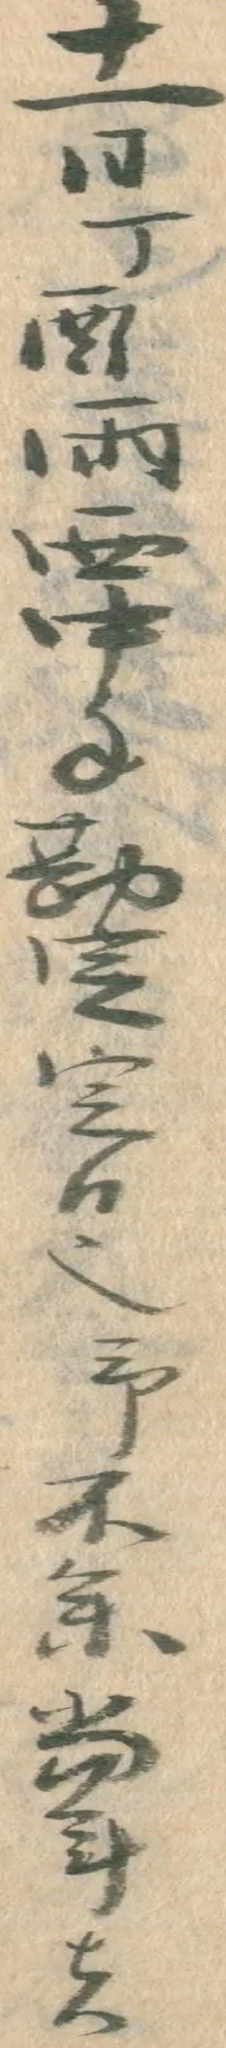十一日丁酉雨、西中手勘定定日也、予不参、當年者
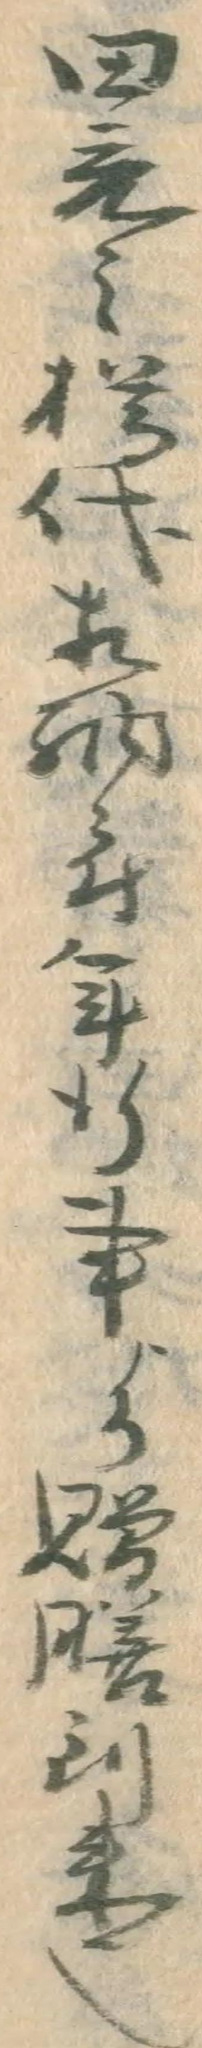田充之樽代相納候二付、年行事より贈膳到来也

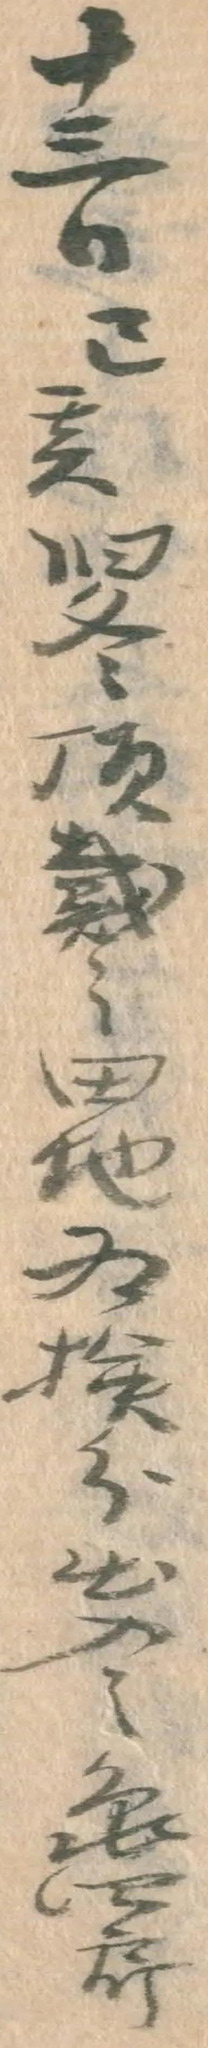十三日己亥、旧冬頂戴之田地、為検分出入之、亀四郎
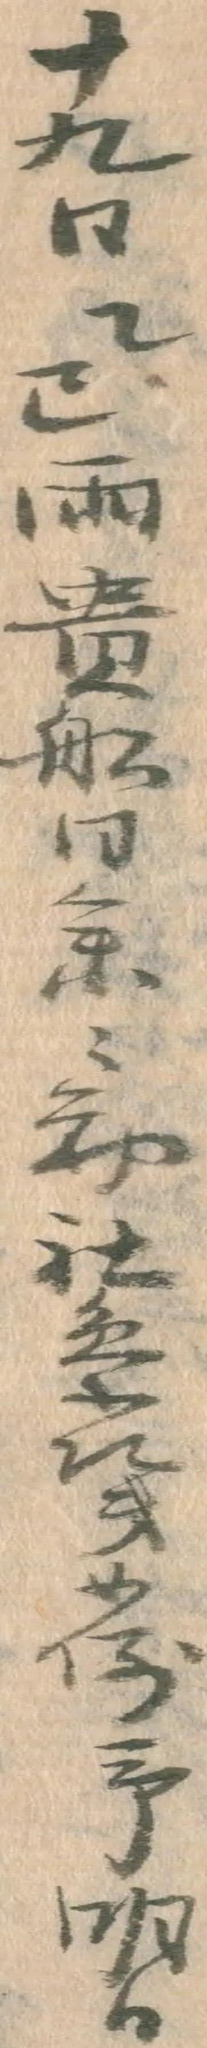十九日乙巳雨、貴船日参〃勤、社参次第如例、予明日
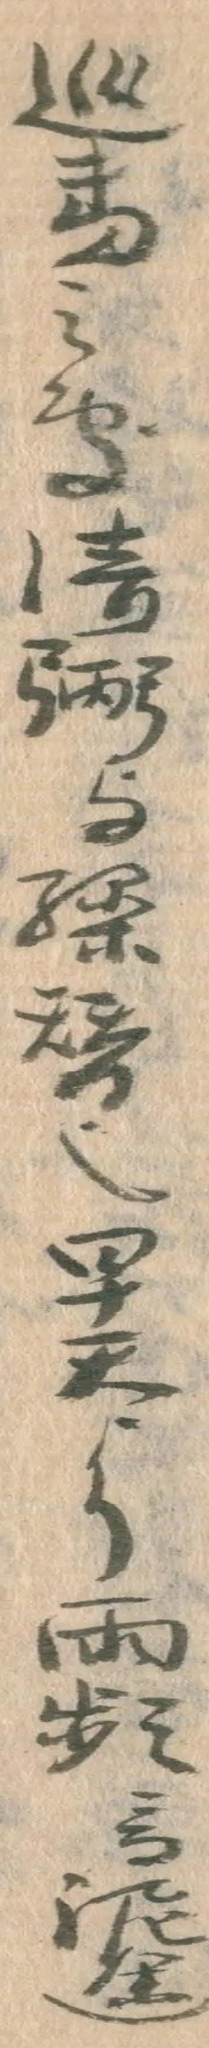巡番之處、清弼と繰替也、早天より雨頻ニ而、泥途
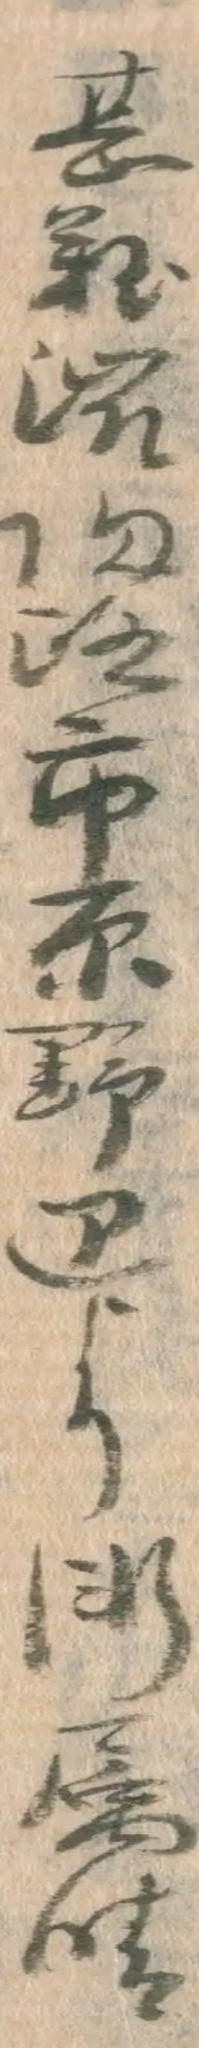甚難渋湯路・市原野辺より漸属晴、
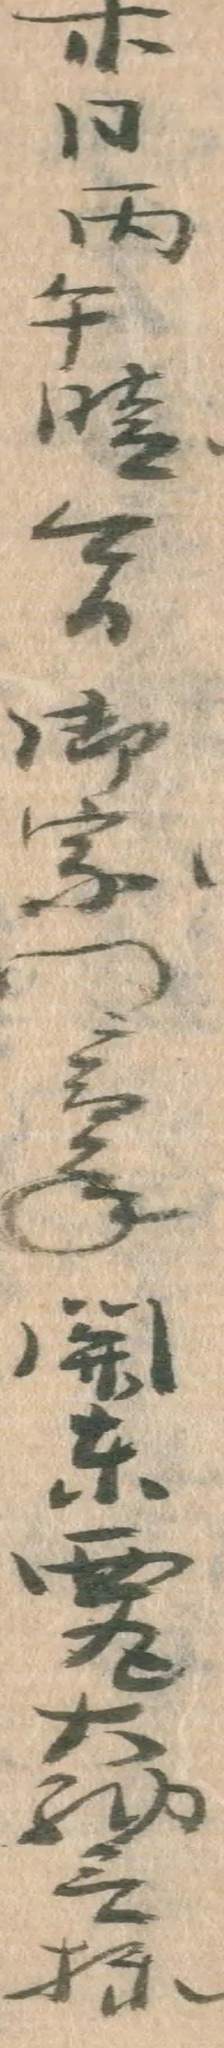廿日丙午晴、今日御家門ニ而承、関東西丸大納言様
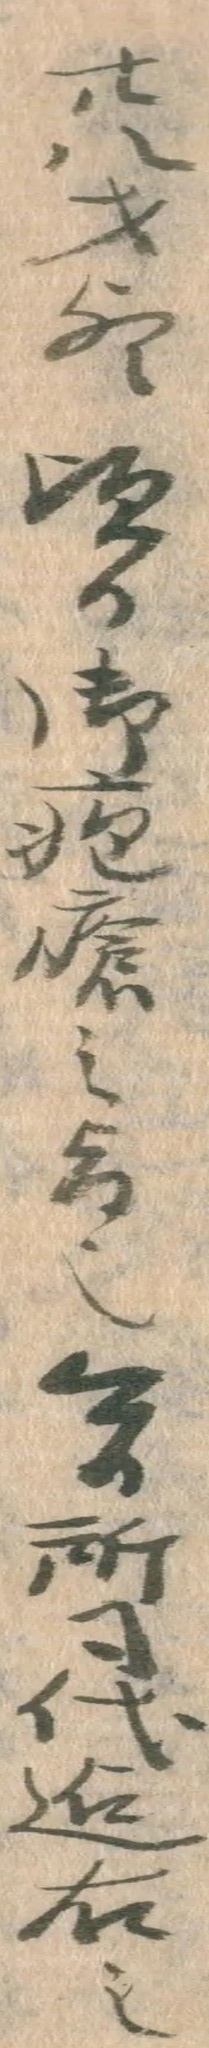廿八才歟、頃日御疱瘡之旨也、今日所司代迄右之
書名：賀茂社記録. 第63冊
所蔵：国立国会図書館 National Diet Library, JAPAN
